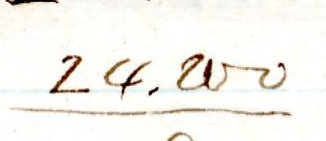24,000
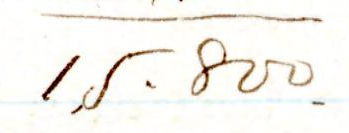15.800
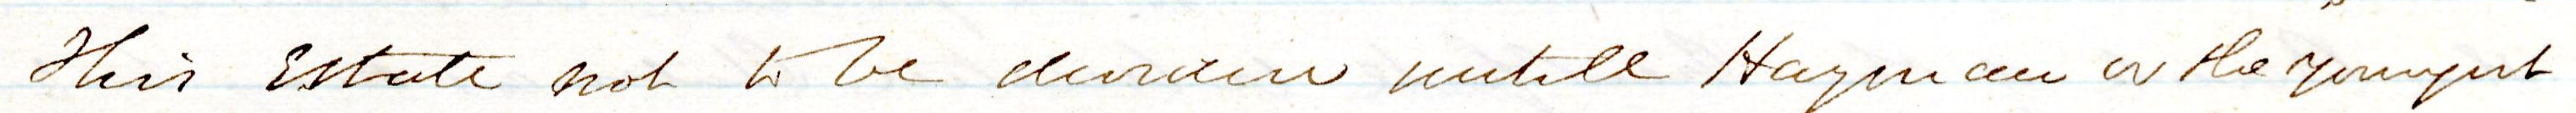this estate not w be auction untill Hayman or the youngest
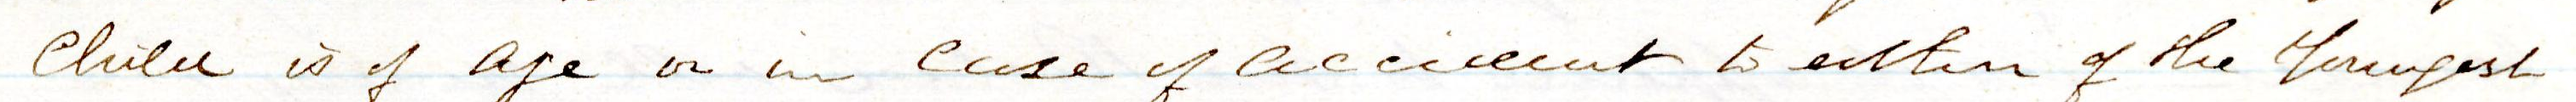child is of Age or in case of accident to either of the youngest
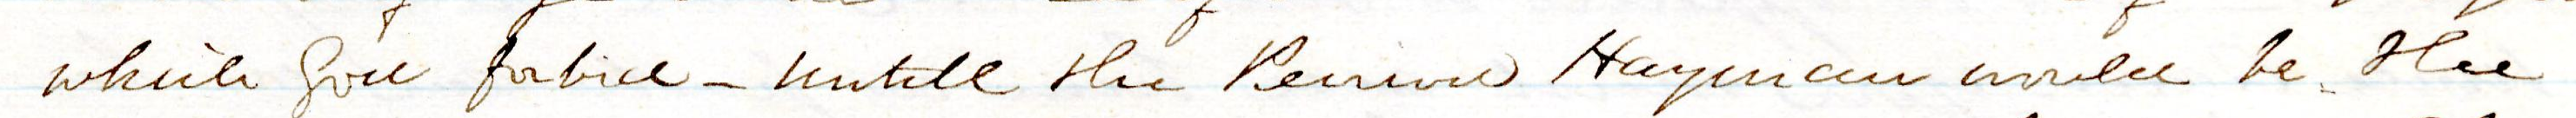which God forbid- untill the Perice Hayman would be thee
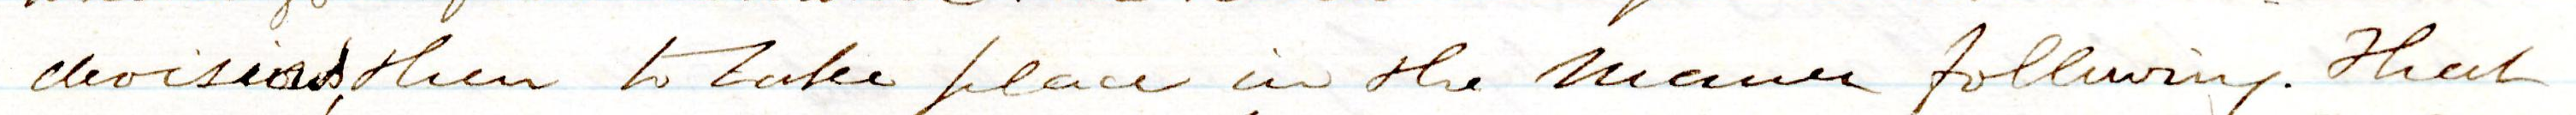devised, them to take place in the maner following. That
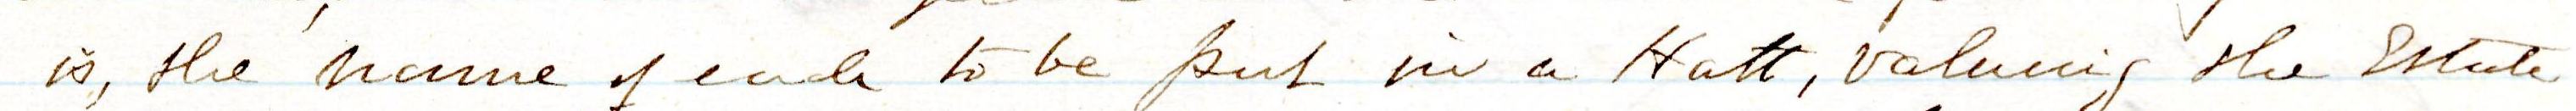is, thee name of each to be put in a Hatt, Valuing the Estate
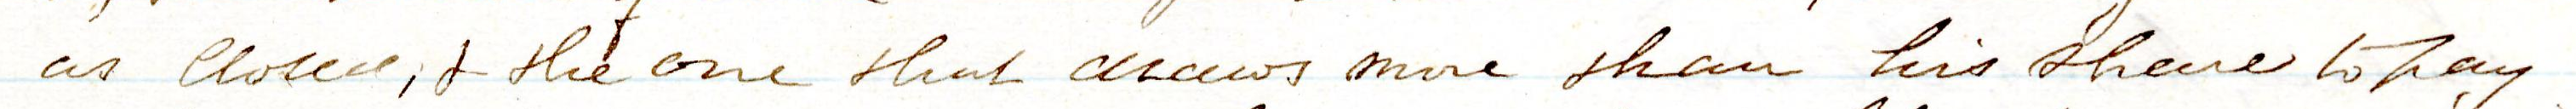as closed, & the one that acrews more than his share to pay
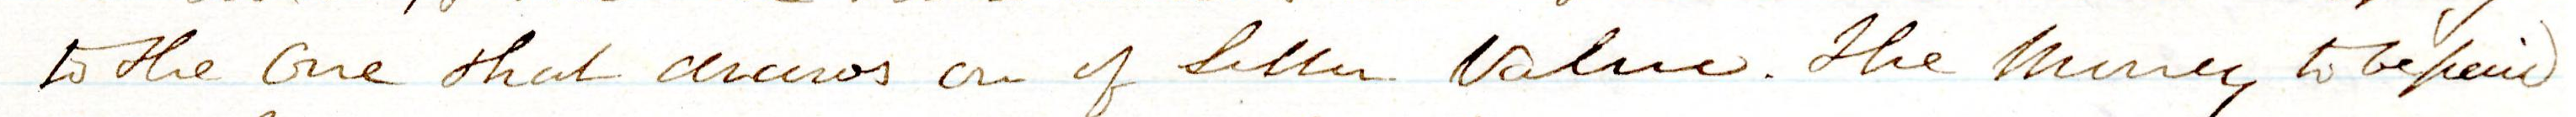to the one that acrues one of lesser value, the money to be paid
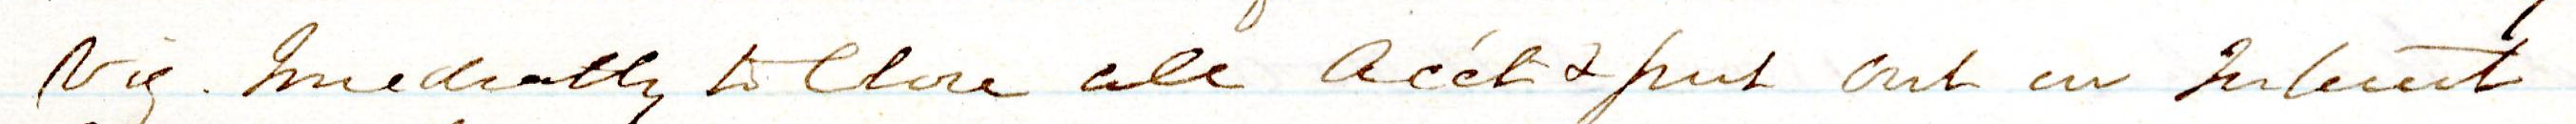Viz. imedeatly at close all Acc't & put out an prelect
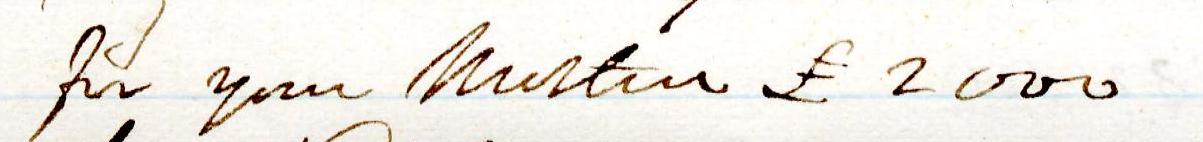for your Mother £2000
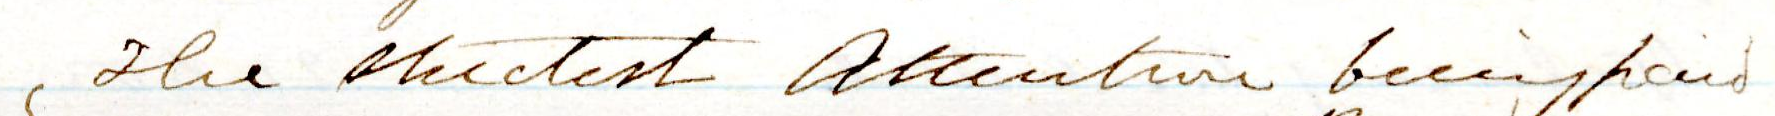the strictest Attention being paid
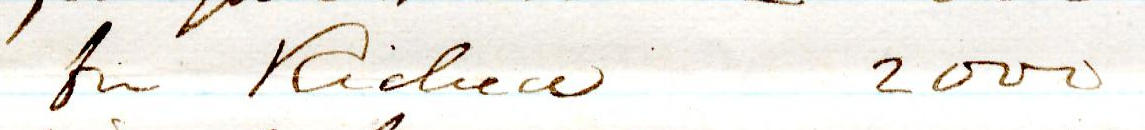for Rideau 2000
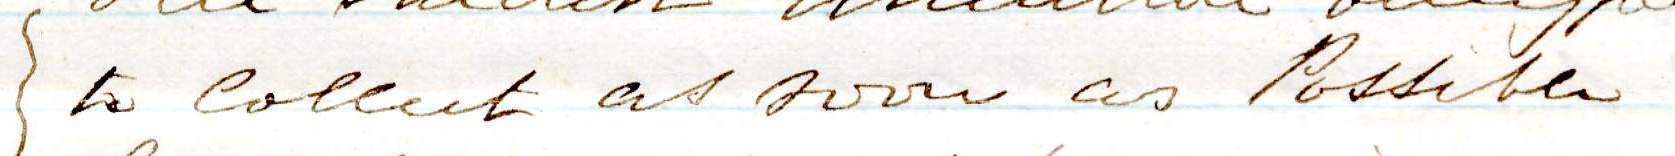to collect as soon as Possible
